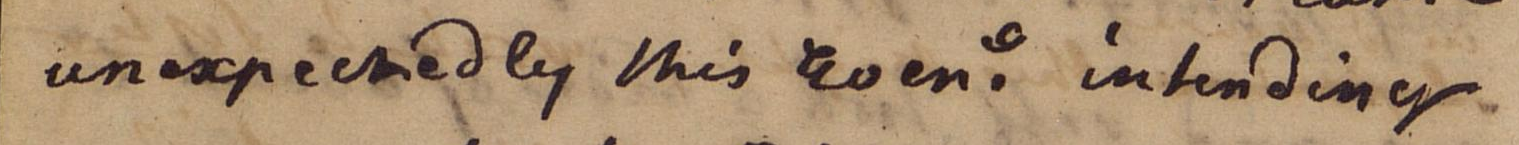unexpectedly this Even^g. intending
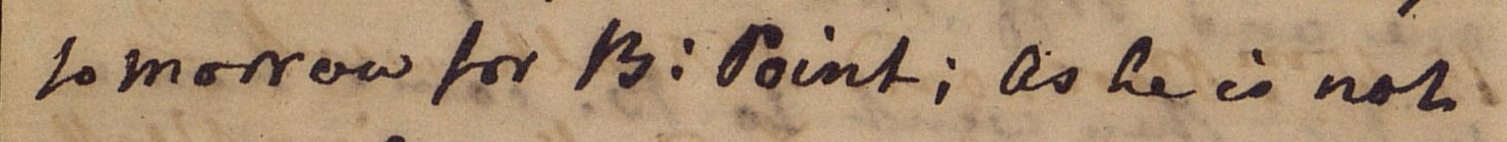to morrow for B: Point; as he is not
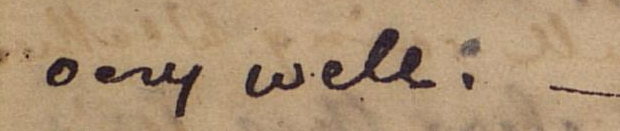very well.-
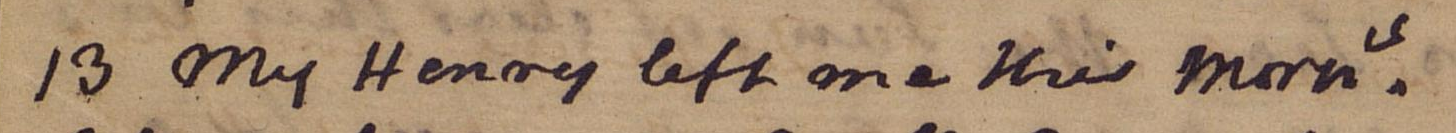13 My Henry left me this morn^g..
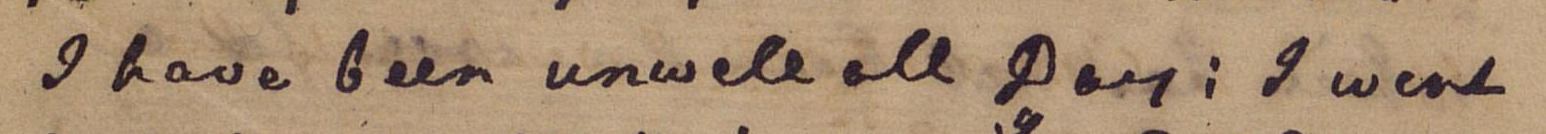I have been unwell all Day: I went
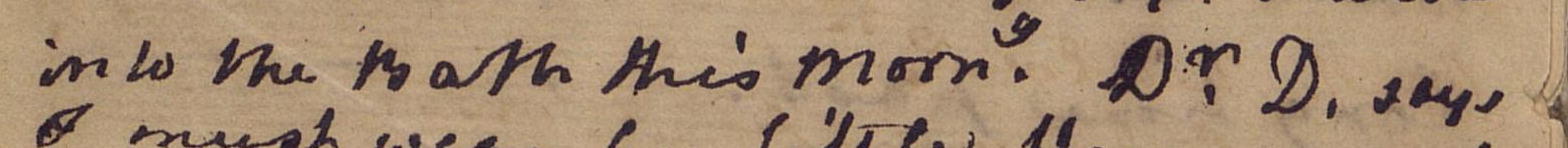into the Bath this morn^g. D^r. D. says
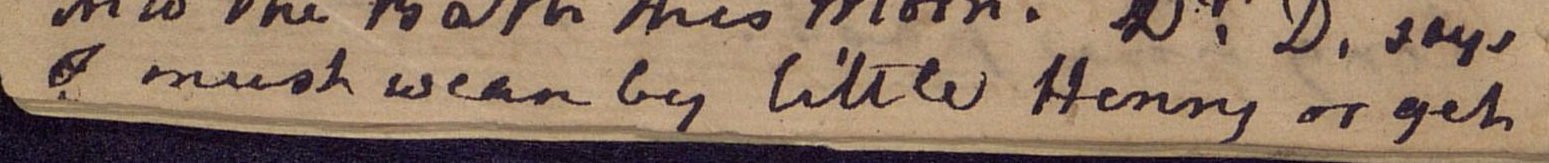I must wean by little Henry or get
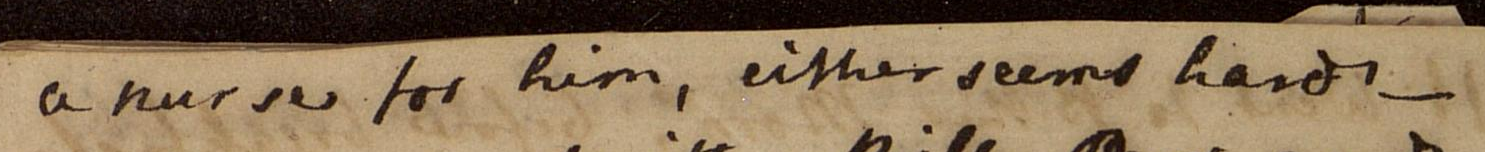a nurse for him, either seems hard-
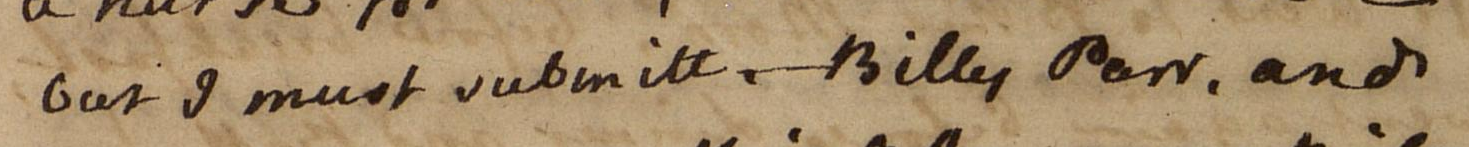but I must submitt- Billy Parr, and
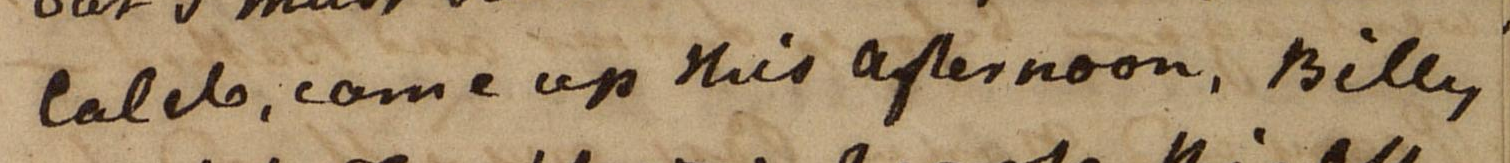Caleb, come up his afternoon, Billy
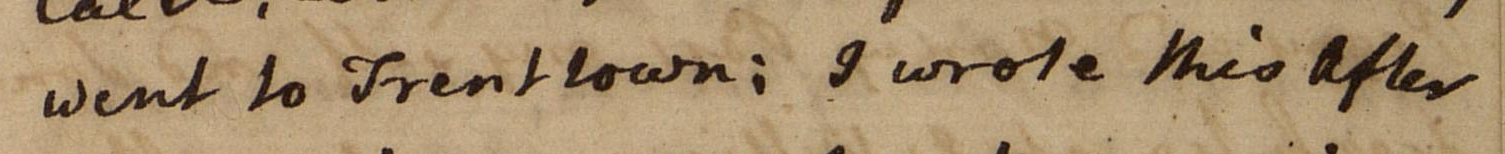went to Trent town, I wrote this after
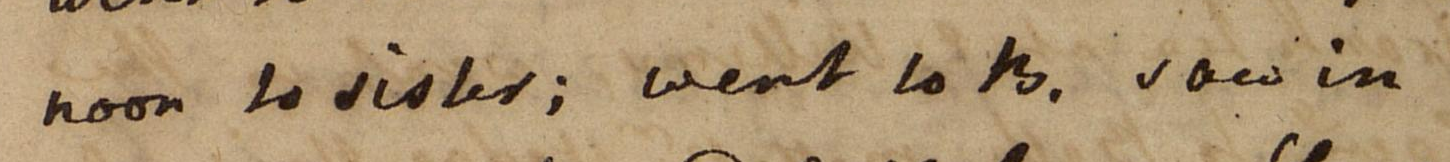noon to sister; went to B. saw in
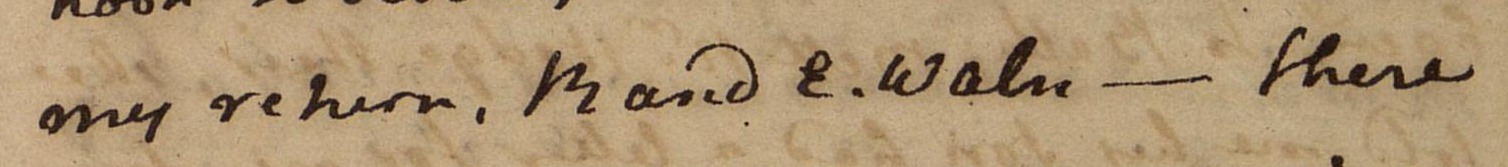my return, Rand E. Waln- there
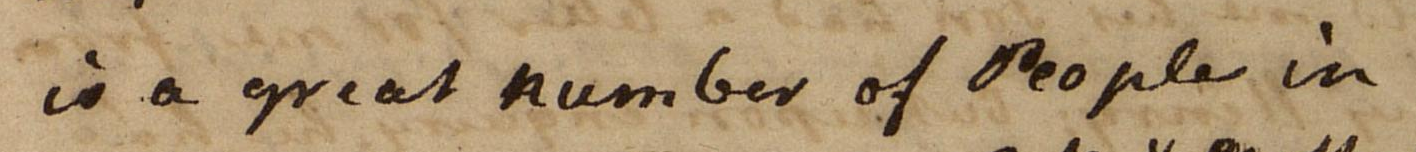is a great number of People in
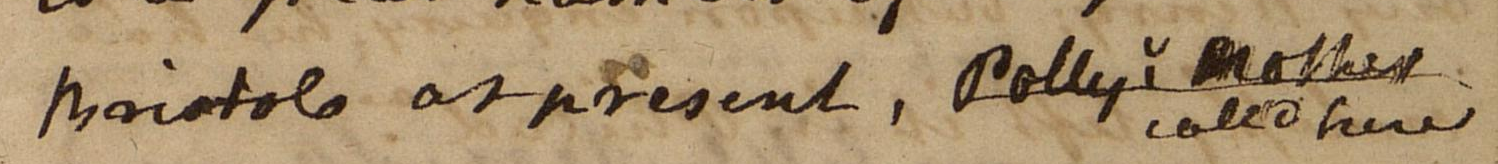Bristol at present, Polly^s Mother
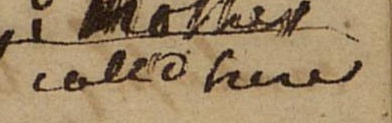call'd here
